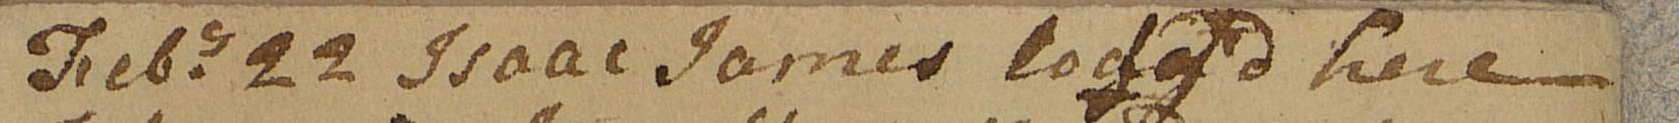Feb^y. 22 Isaac James lodg'd here
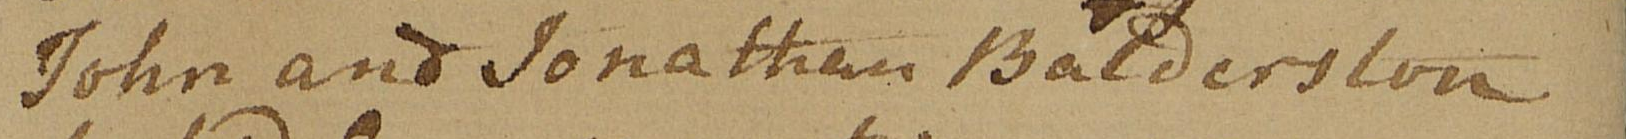John and Jonathan Balderston,
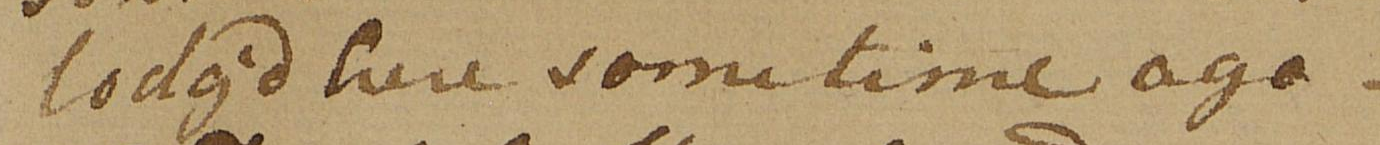lodg'd here some time ago-
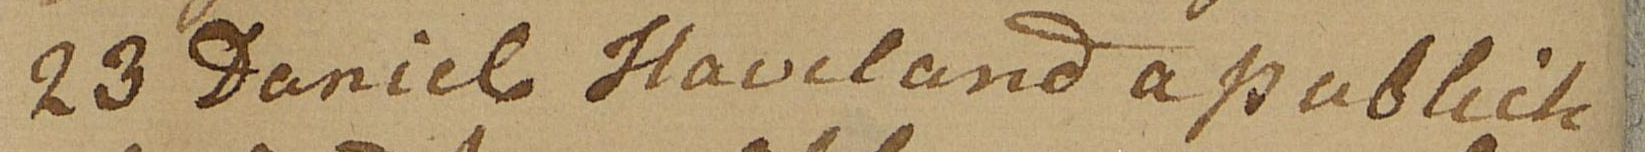23 Daniel Haveland a publick
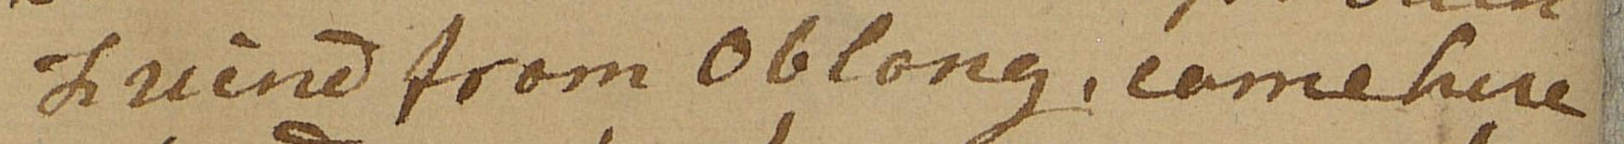Friend from Oblong, came here
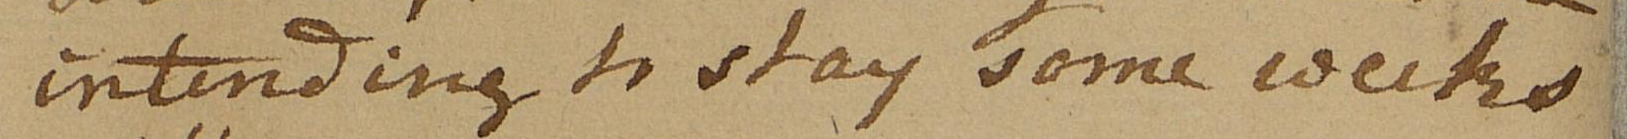intending to stay some weeks
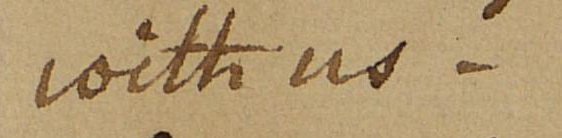with us-
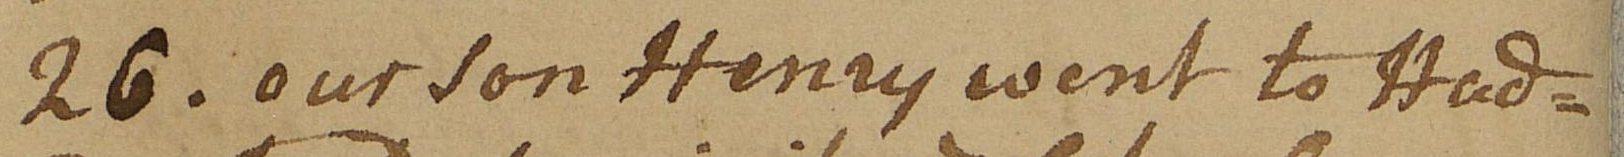26. our son Henry went to Had-
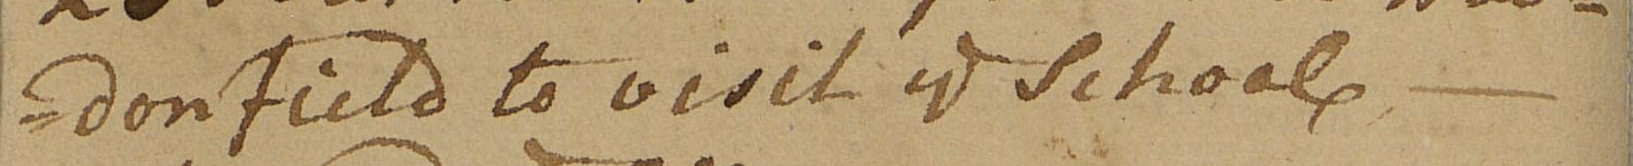-donfield to visit y^e School-
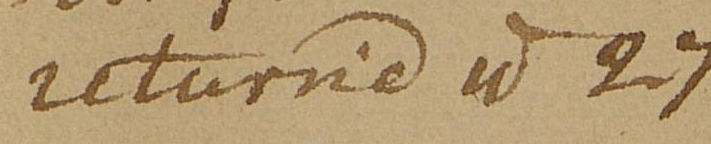return'd y^e 27
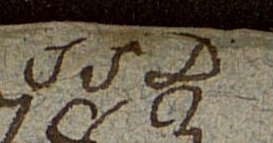JSD
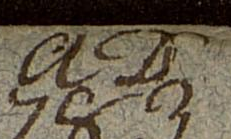AD
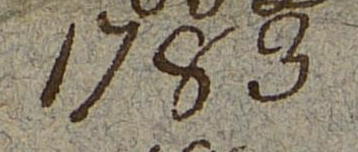1783
